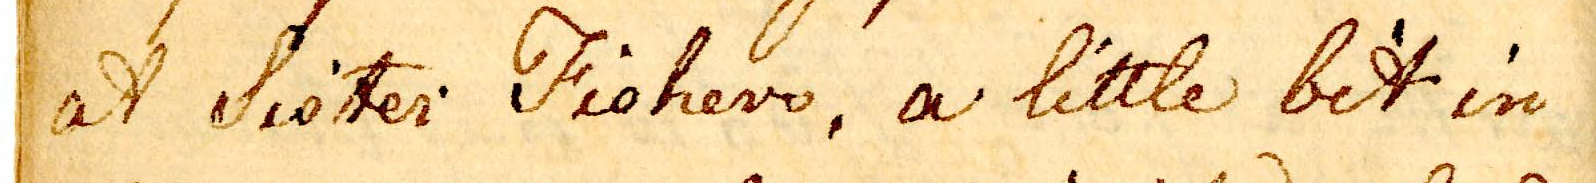at Sister Fishers, a little bit in
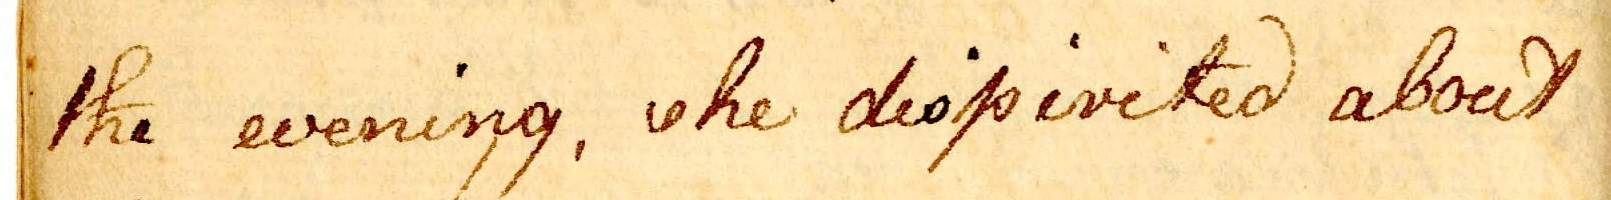the evening, she dispirited about
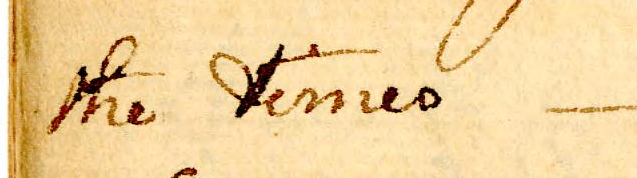the times-
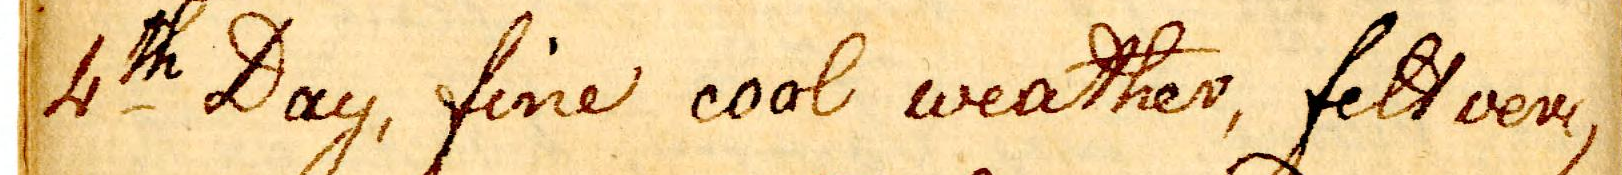4^th Day, fine cool weather, felt very
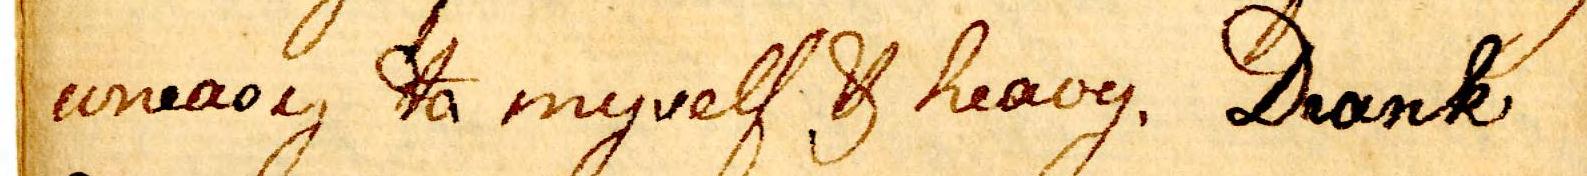uneasy to myself & heavy. Drank
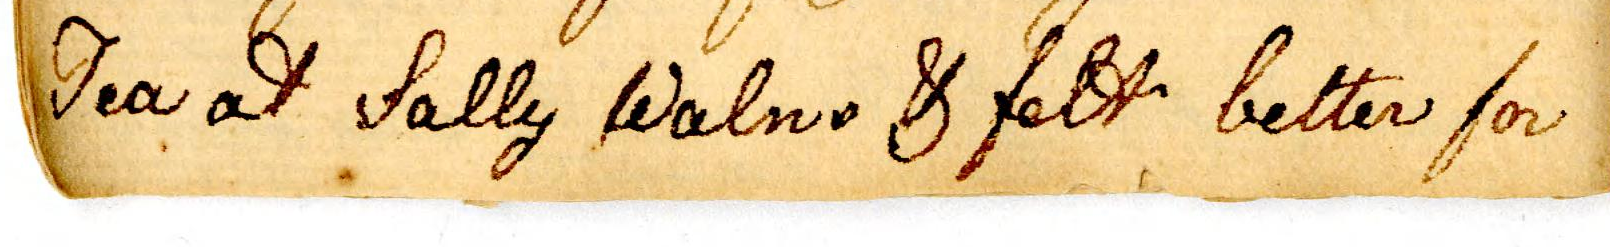Tea at Sally Walns & felt better for
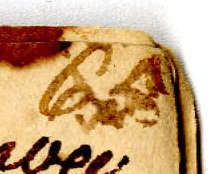65
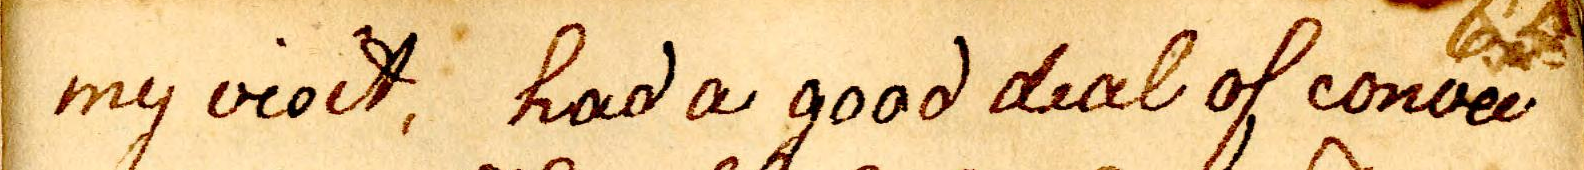my visit, had a good deal of conver
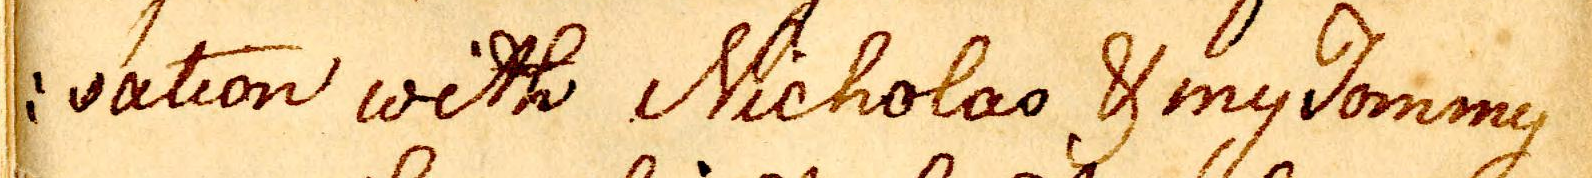-sation with Nicholas & my Tommy
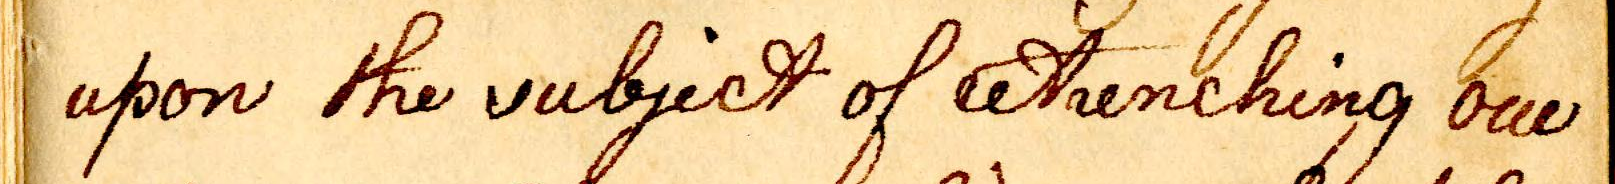upon the subject of retrenching our
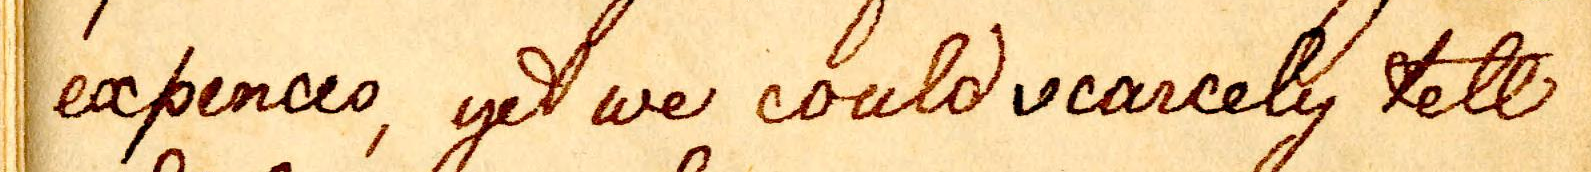expences, yet we could scarcely tell
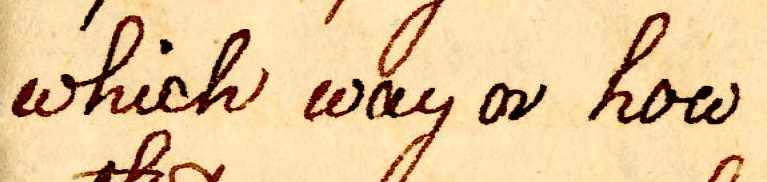which way or how
